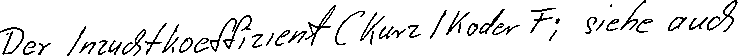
Der Inzuchtkoeffizient (kurz IK oder F; siehe auch
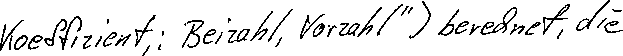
Koeffizient: "Beizahl, Vorzahl") berechnet die
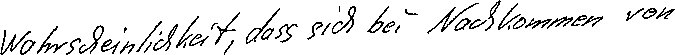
Wahrscheinlichkeit, dass sich bei Nachkommen von
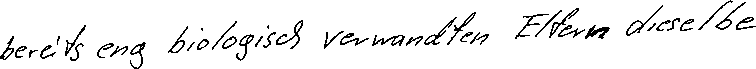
bereits eng biologisch verwandten Eltern dieselbe
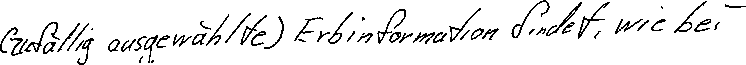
(zufällig ausgewählte) Erbinformation findet wie bei
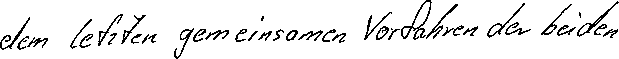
dem letzten gemeinsamen Vorfahren der beiden
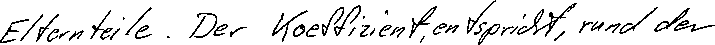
Elternteile. Der Koeffizient entspricht rund der
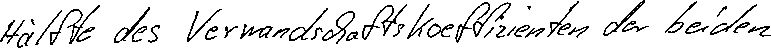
Hälfte des Verwandtschaftskoeffizienten der beiden
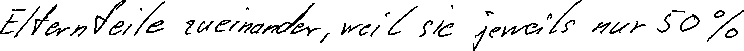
Elternteile zueinander, weil sie jeweils nur 50 %
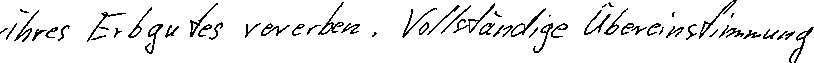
ihres Erbgutes vererben. Vollständige Übereinstimmung
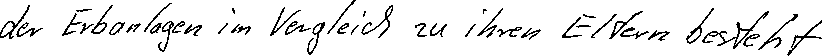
der Erbanlagen im Vergleich zu ihren Eltern besteht
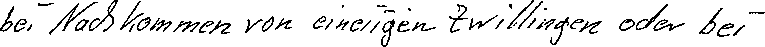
bei Nachkommen von eineiigen Zwillingen oder bei
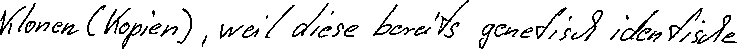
Klonen (Kopien), weil diese bereits genetisch identische
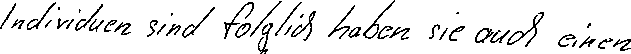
Individuen sind folglich haben sie auch einen
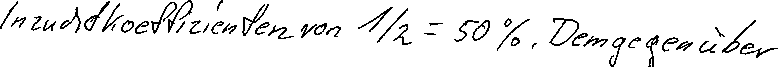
Inzuchtkoeffizienten von 1/2 = 50 %. Demgegenüber
